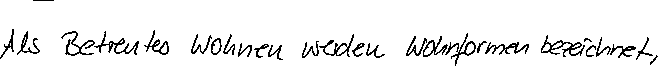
Als Betreutes Wohnen werden Wohnformen bezeichnet,
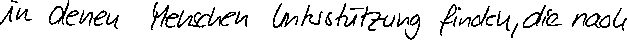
in denen Menschen Unterstützung finden, die nach
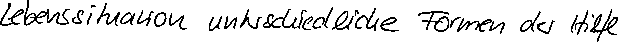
Lebenssituation unterschiedliche Formen der Hilfe
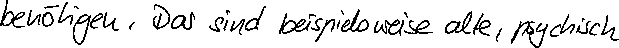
benötigen. Das sind beispielsweise alte, psychisch
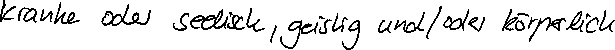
kranke oder seelisch, geistig und/oder körperlich
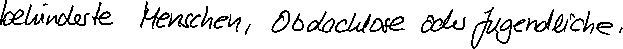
behinderte Menschen, Obdachlose oder Jugendliche.
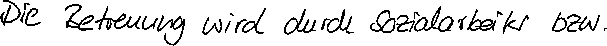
Die Betreuung wird durch Sozialarbeiter bzw.
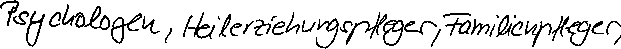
Psychologen, Heilerziehungspfleger, Familienpfleger,
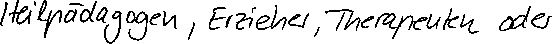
Heilpädagogen, Erzieher, Therapeuten oder
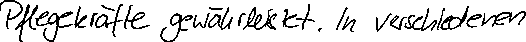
flegekräfte gewährleistet. In verschiedenen
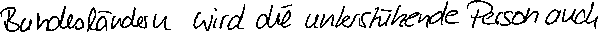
Bundesländern wird die unterstützende Person auch
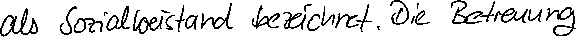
als Sozialbeistand bezeichnet. Die Betreuung
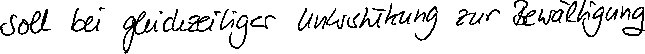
soll bei gleichzeitiger Unterstützung zur Bewältigung
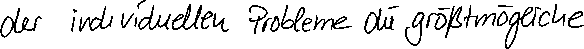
der individuellen Probleme die größtmögliche
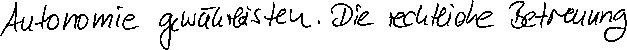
Autonomie gewährleisten. Die rechtliche Betreuung
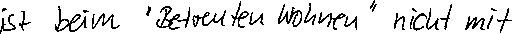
ist beim "Betreuten Wohnen" nicht mit
